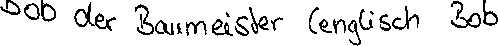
Bob der Baumeister (englisch Bob
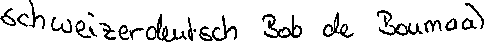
schweizerdeutsch Bob de Boumaa)
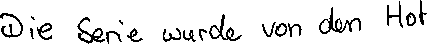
Die Serie wurde von den Hot
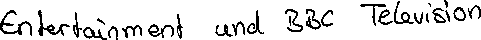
Entertainment und BBC Television
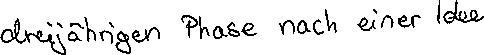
dreijährigen Phase nach einer Idee
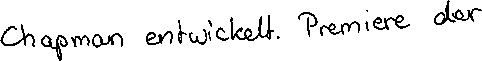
Chapman entwickelt. Premiere der
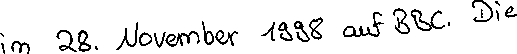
im 28. November 1998 auf BBC. Die
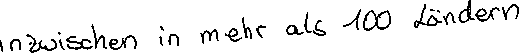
inzwischen in mehr als 100 Ländern
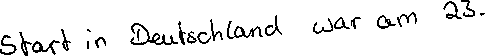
Start in Deutschland war am 23.
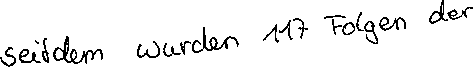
seitdem wurden 117 Folgen der
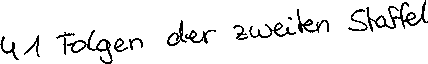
41 Folgen der zweiten Staffel
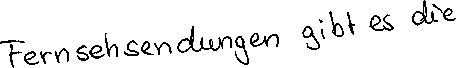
Fernsehsendungen gibt es die
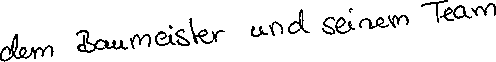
dem Baumeister und seinem Team
